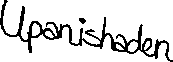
Upanishaden
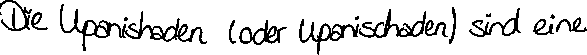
Die Upanishaden (oder Upanischaden) sind eine
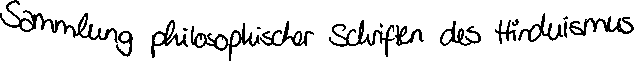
Sammlung philosophischer Schriften des Hinduismus
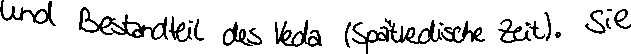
und Bestandteil des Veda (Spätvedische Zeit). Sie
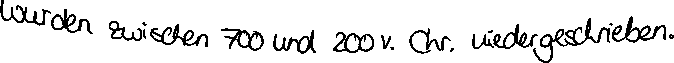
wurden zwischen 700 und 200 v. Chr. niedergeschrieben.
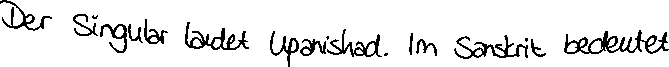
Der Singular lautet die Upanishad. Im Sanskrit bedeutet
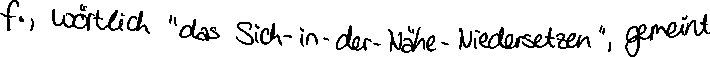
f., wörtlich "das Sich-in-der-Nähe-Niedersetzen", gemeint
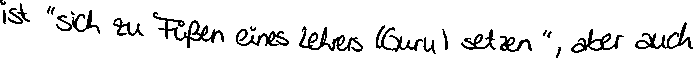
ist "sich zu Füßen eines Lehrers (Guru) setzen", aber auch
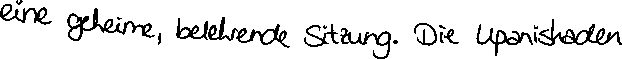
eine geheime, belehrende Sitzung. Die Upanishaden
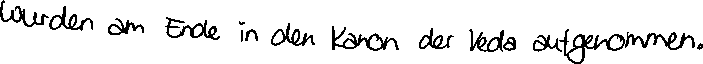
wurden am Ende in den Kanon der Veda aufgenommen.
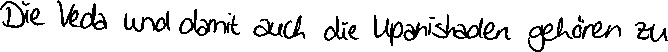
Die Veda und damit auch die Upanishaden gehören zu
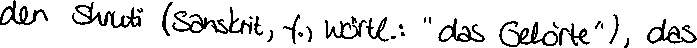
den Shruti (Sanskrit, f., wörtl.: "das Gehörte"), das
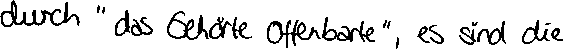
durch "das Gehörte Offenbarte", es sind die
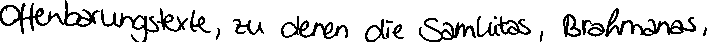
Offenbarungstexte, zu denen die Samhitas, Brahmanas,
